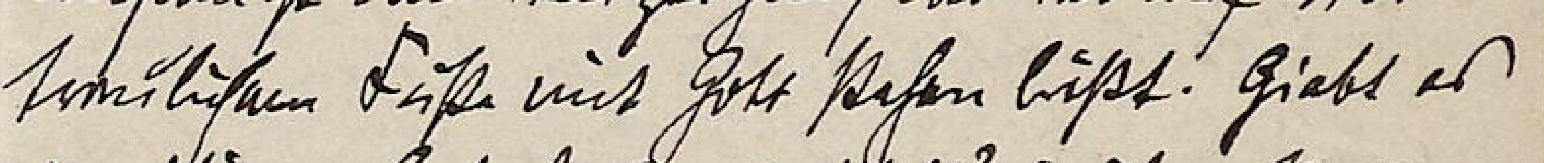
traulichem Fuße mit Gott stehen läßt. Giebt es
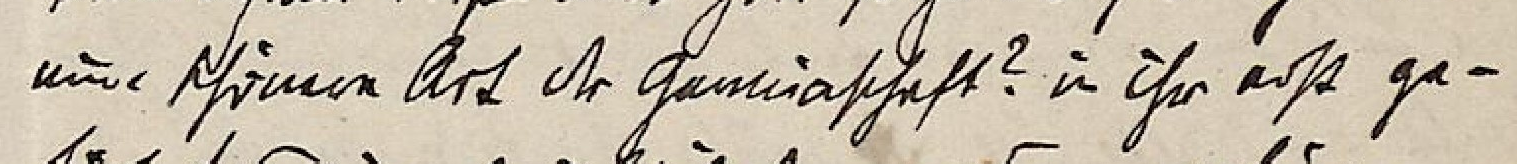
eine schönere Art der Gemeinschaft? in ihr erst ge¬
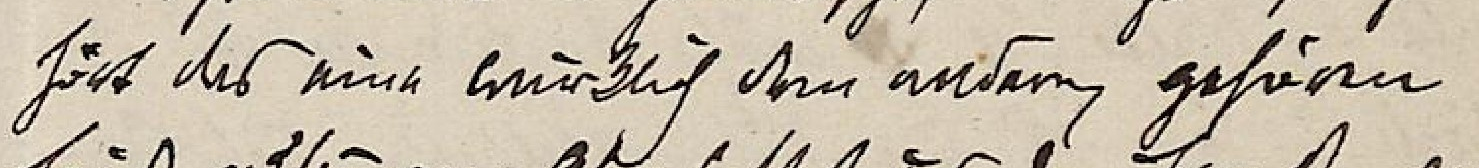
hört das eine wirklich dem anderen, gehören
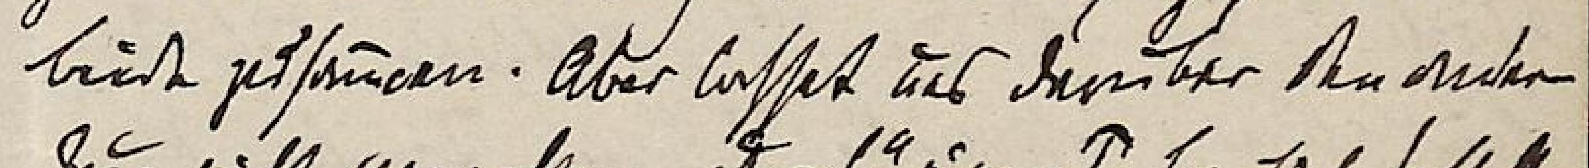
beide zusamen. Aber lasset uns darunter den andere
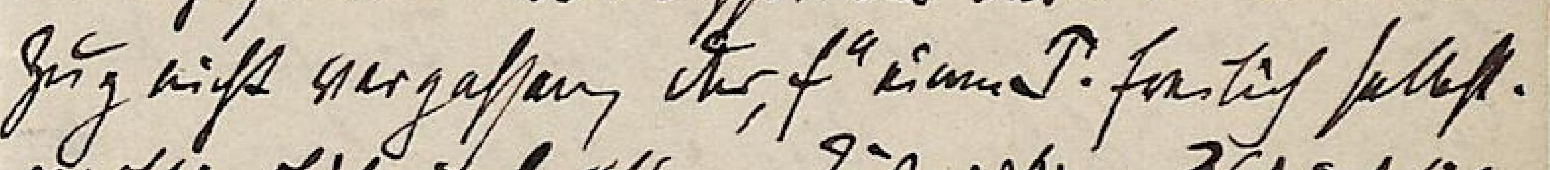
Zug nicht vergessen, der fü einen P. freilich selbst.
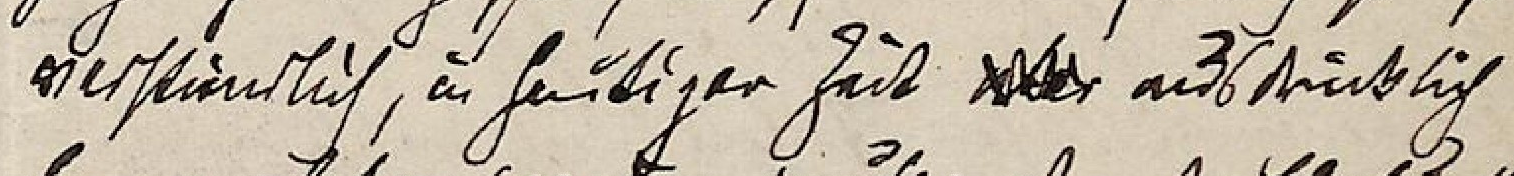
verständlich, in heutiger Zeit aber ausdrücklich
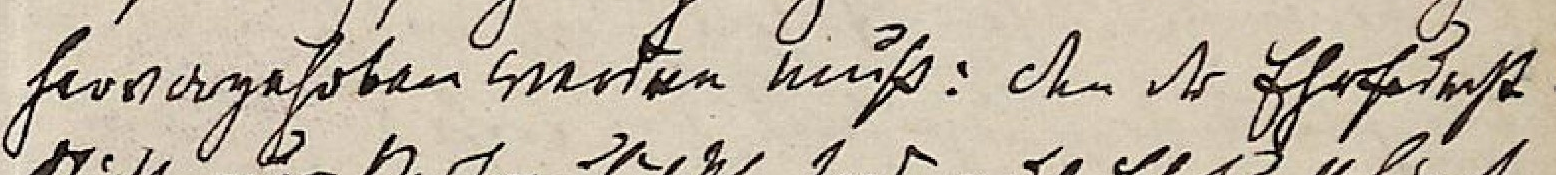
hervorgehoben werden muß: den der Ehrfurcht.
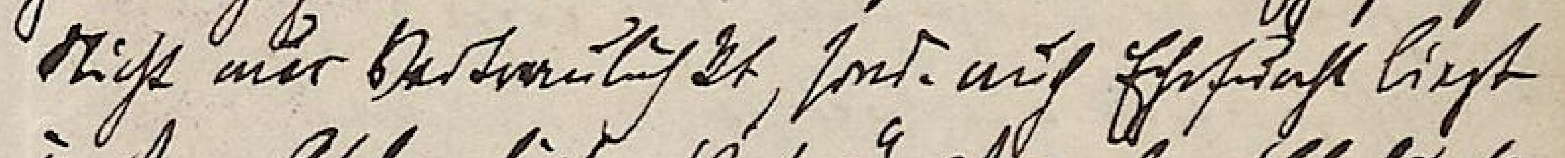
Nicht nur Vertraulichkeit, sond. auch Ehrfurcht liegt
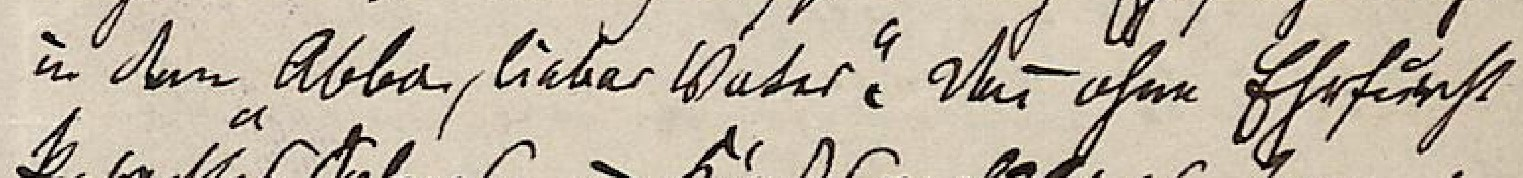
in dem "Abba, lieber Vater." Den ohne Ehrfurcht
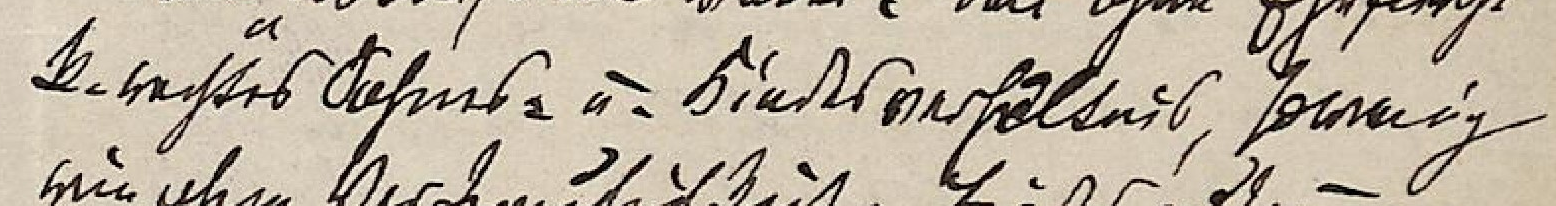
kein rechtes Sohns- un Kindsverhältnis, sowenig
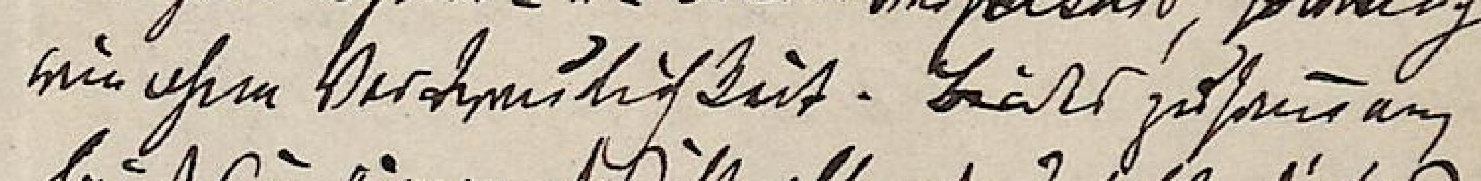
wie ohne Vertraulichkeit. Beides zusammen,
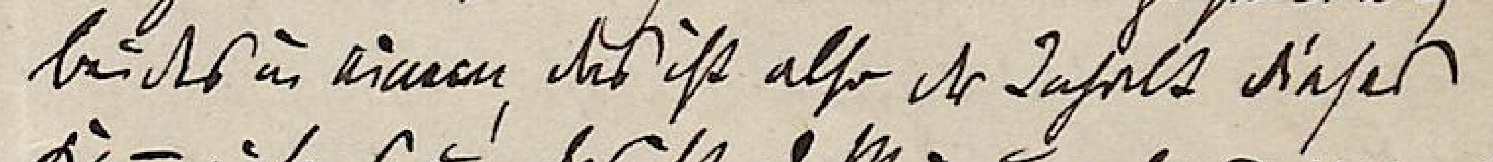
beides in einem, das ist also der Inhalt dieses
